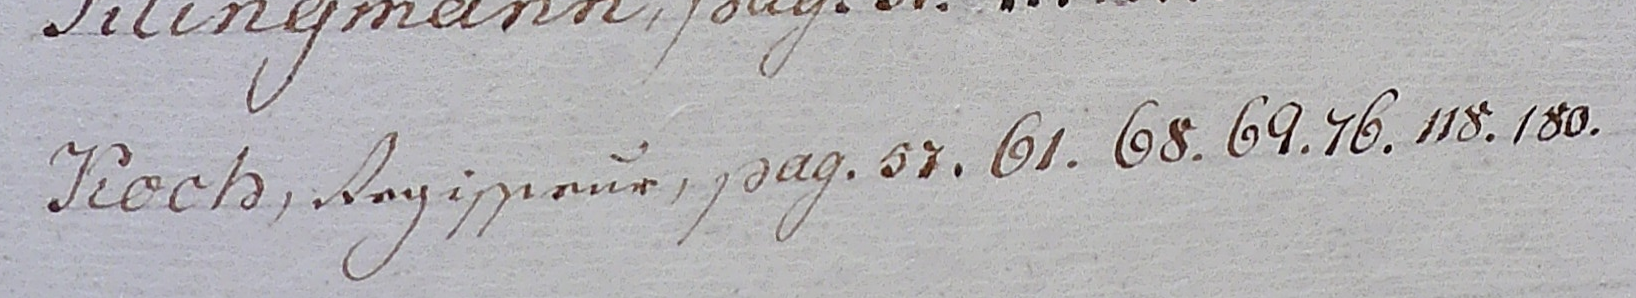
Koch, Regisseur, pag. 57. 61. 68. 69. 76. 118. 180.
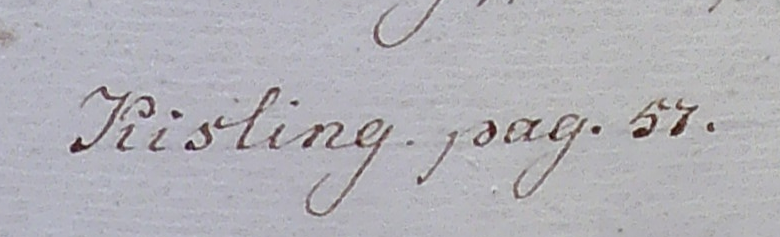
Kisling. pag. 57.
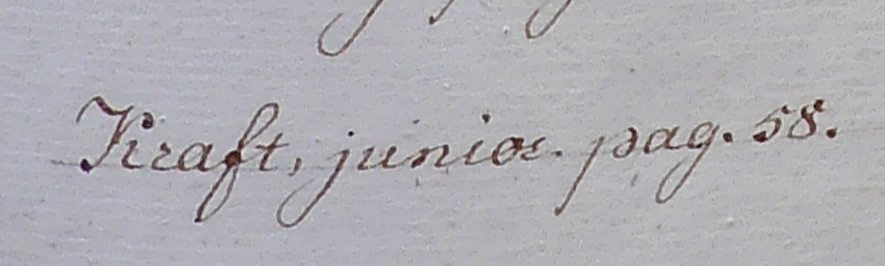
Kraft, junior. pag. 58.
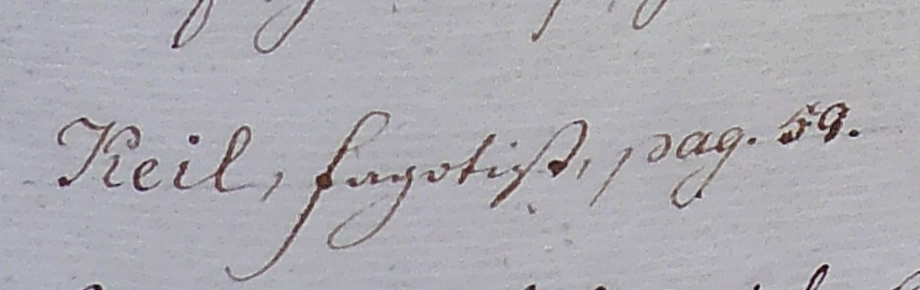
Keil, Fagotist, pag. 59.
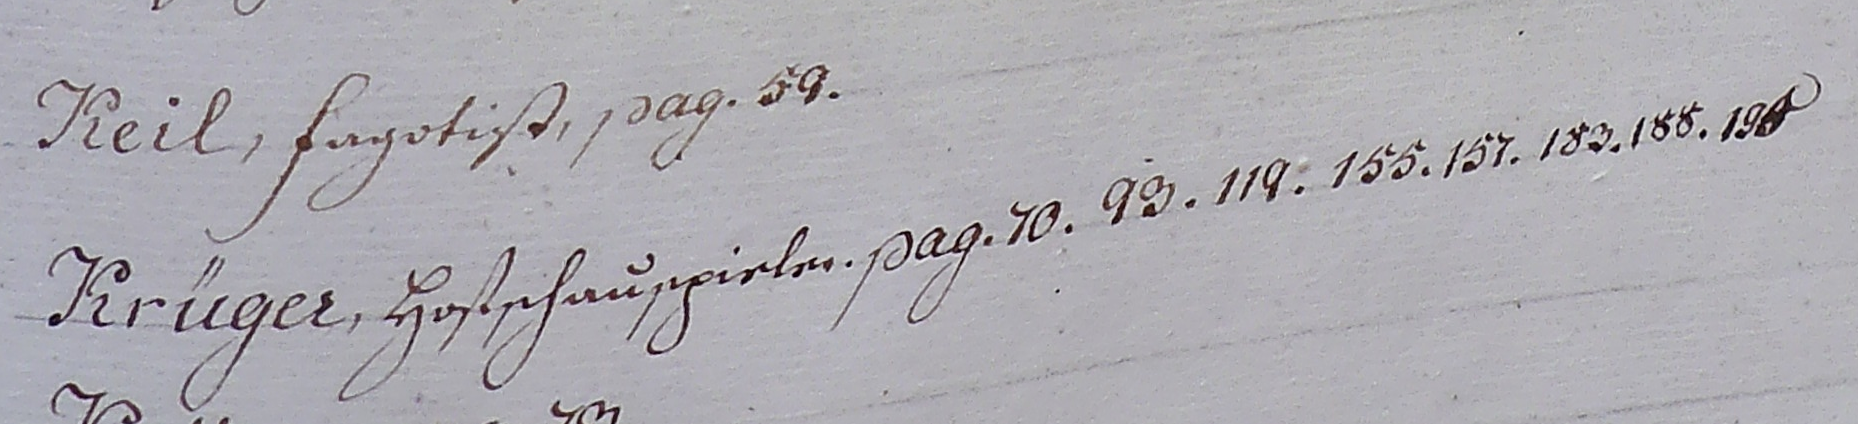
Krüger, Hofschauspieler. pag. 70. 93. 119. 155. 157. 183. 188. 195.
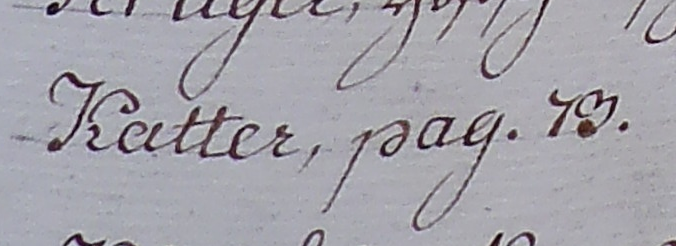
Katter, pag. 73.
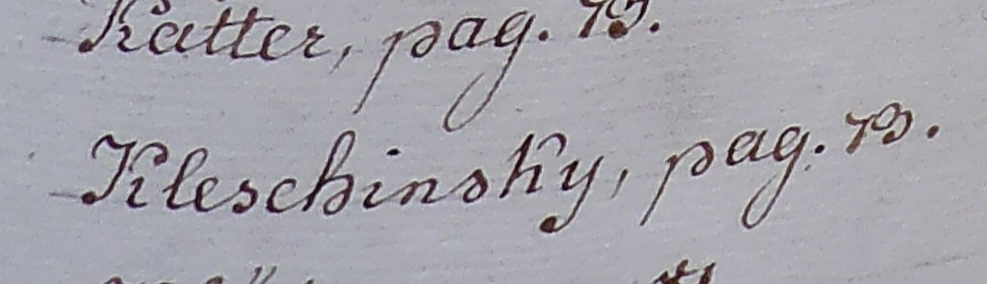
Kleschinsky, pag. 73.
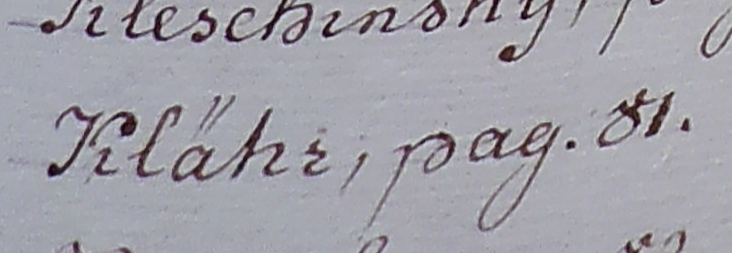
Klähr, pag. 81.
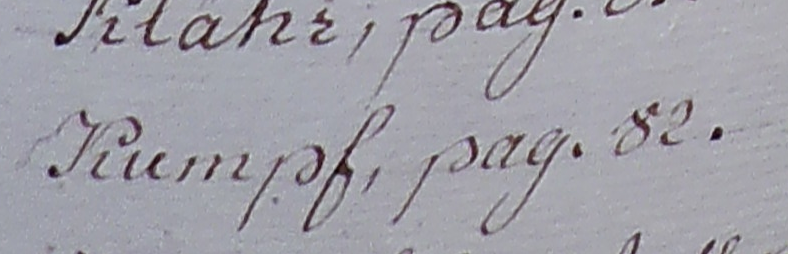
Kumpf, pag. 81.
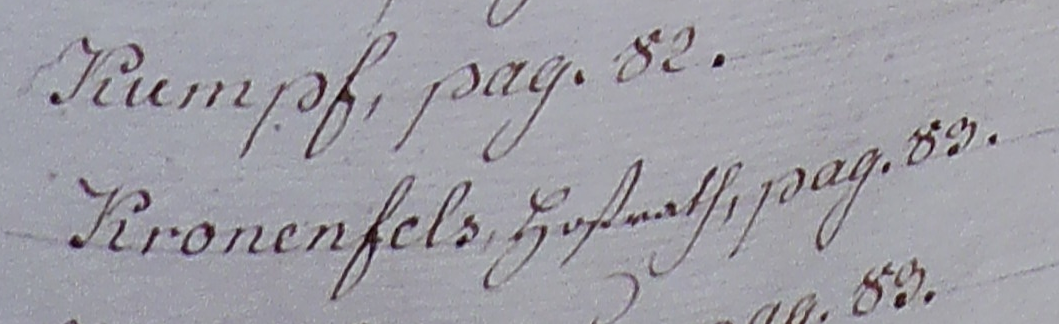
Kronenfels, Hofrath, pag. 83.
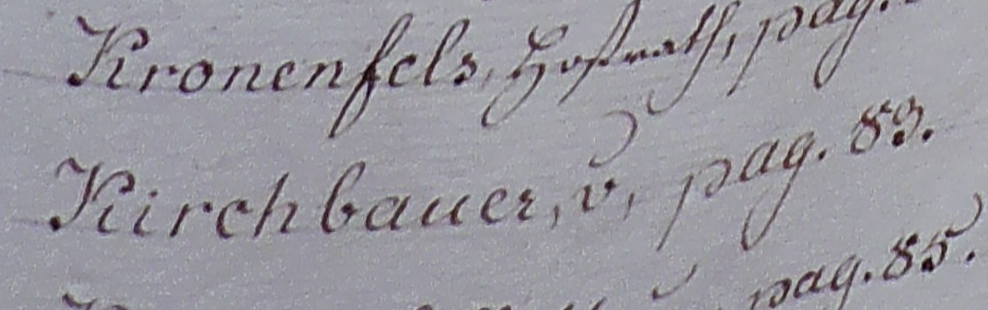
Kirchbauer, v, pag. 83.
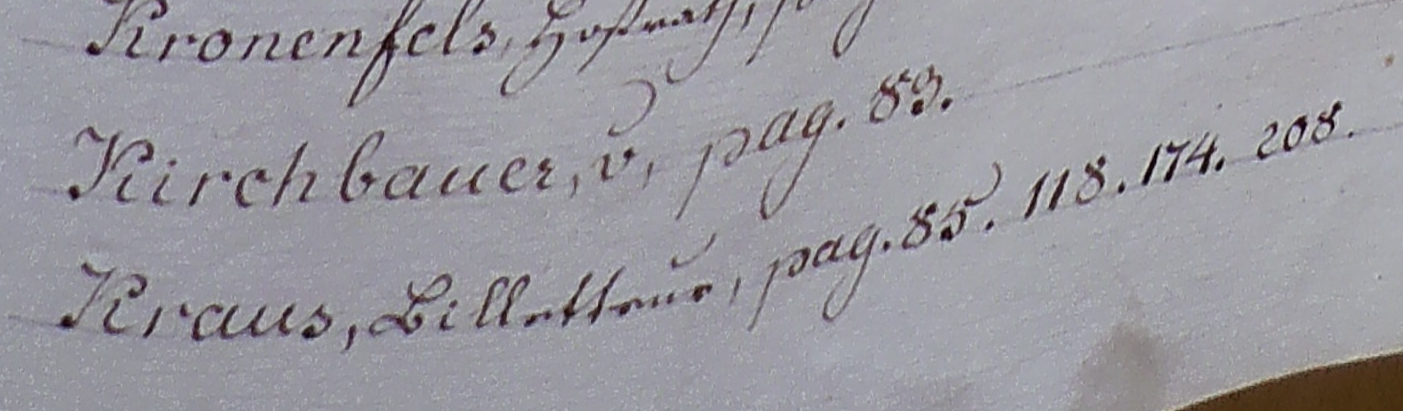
Kraus, Billetteur, pag. 85. 118. 174. 208.
